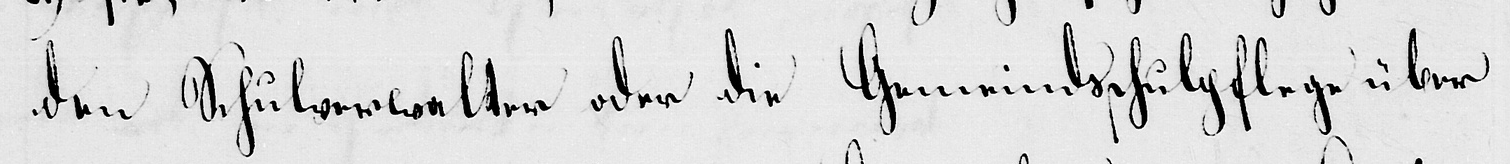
den Schulverwalter oder die Gemeindsschulpflege über
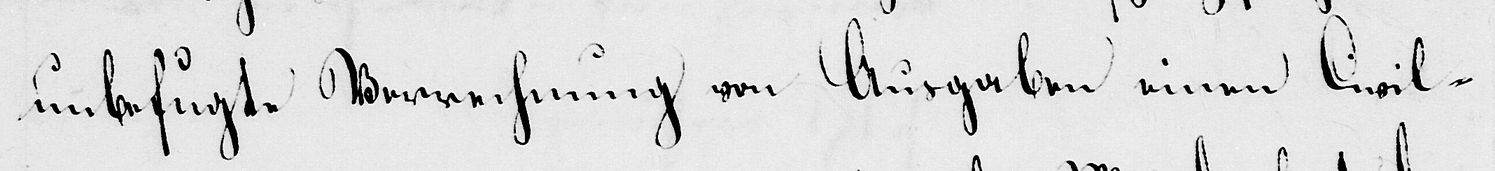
unbefugte Verrechnung von Ausgaben einen Civil¬
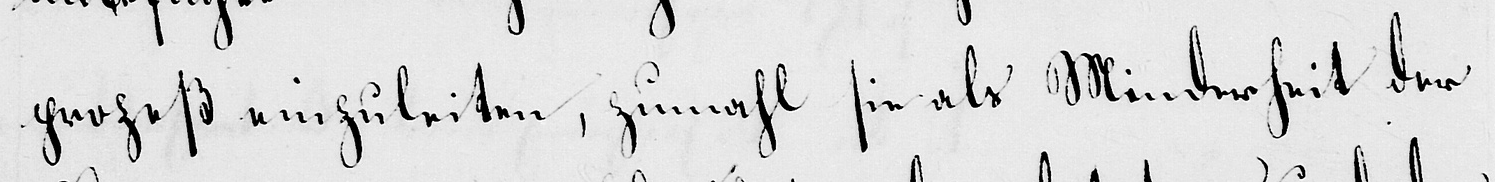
prozeß einzuleiten, zumahl sie als Minderheit der
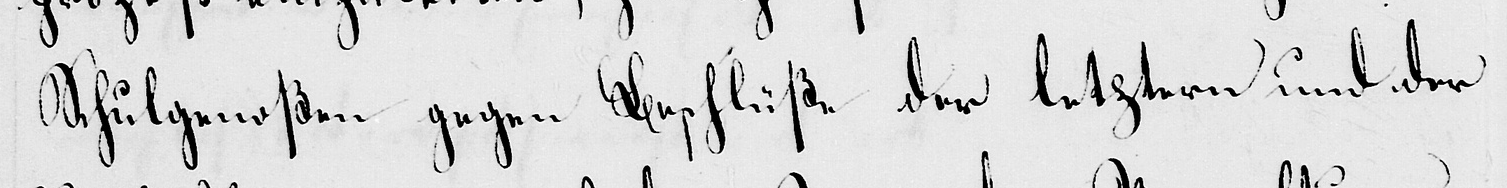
Schulgenoßen gegen Beschlüße der letztern und der
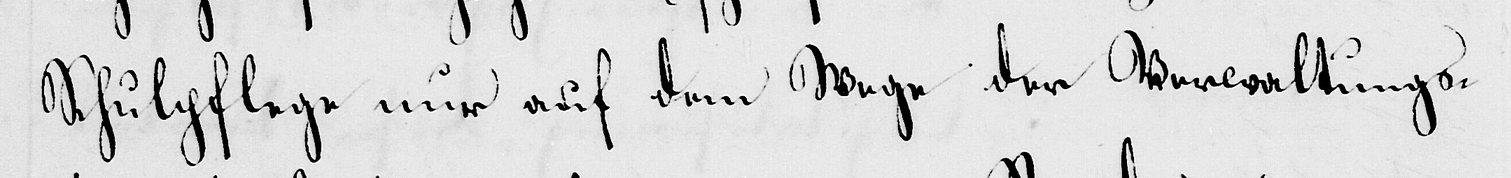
Schulpflege nur auf dem Wege der Verwaltungs¬
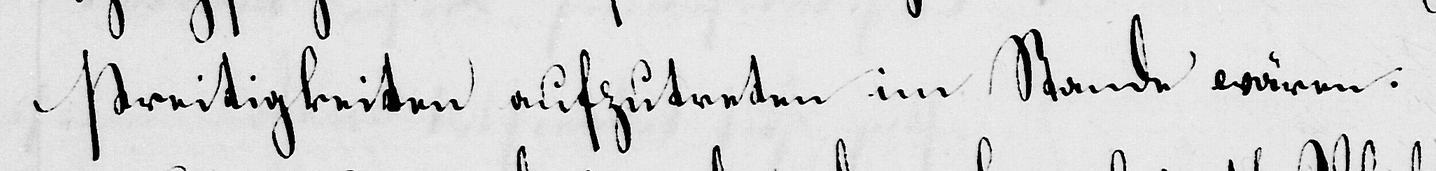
streitigkeiten aufzutreten im Stande wären.
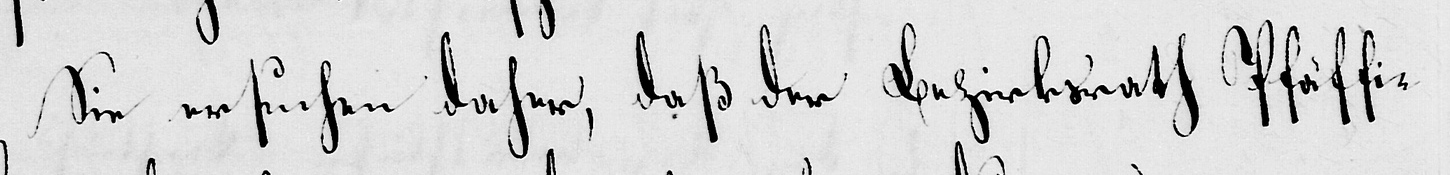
Sie ersuchen daher, daß der Bezirksrath Pfäffi¬
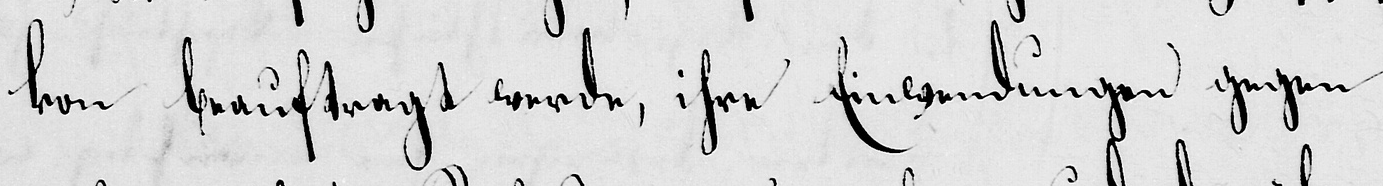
kon beauftragt werde, ihre Einwendungen gegen
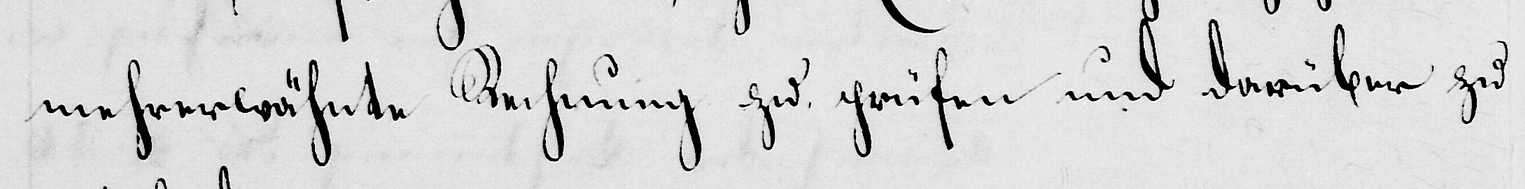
mehrerwähnte Rechnung zu prüfen und darüber zu
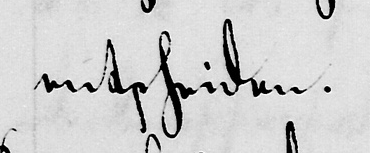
entscheiden.
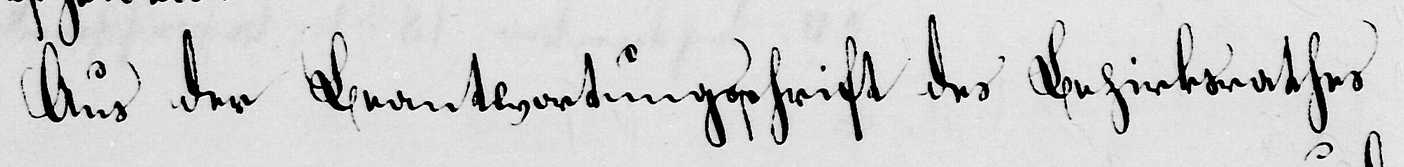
Aus der Beantwortungsschrift des Bezirksrathes
